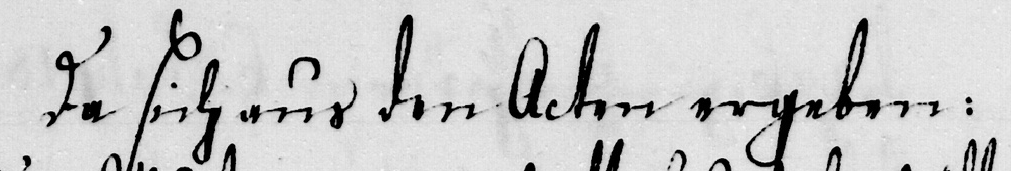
Da sich aus den Acten ergeben:
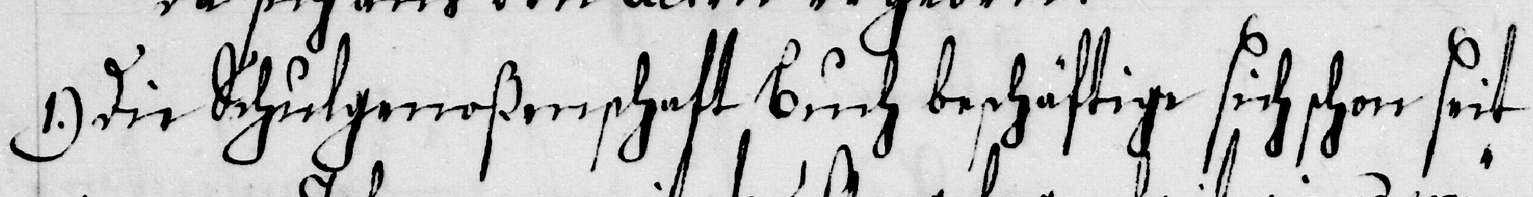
Die Schulgenoßenschaft Buch beschäftige sich schon
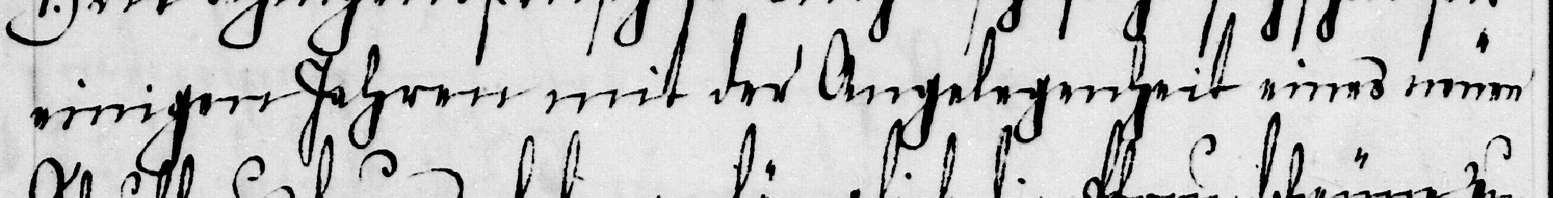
einigen Jahren mit der Angelegenheit eines neuen
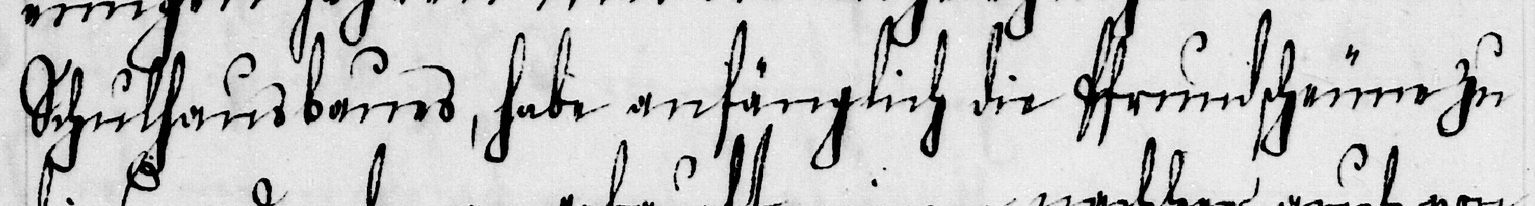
Schulhausbaus, habe anfänglich die Pfrundscheune zu
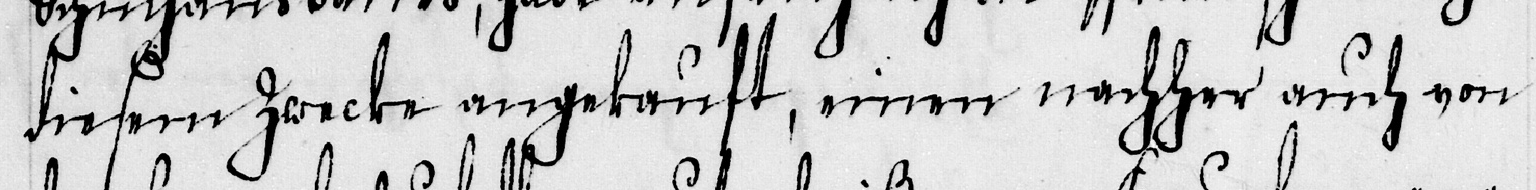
diesem Zwecke angekauft, einen nachher auch von
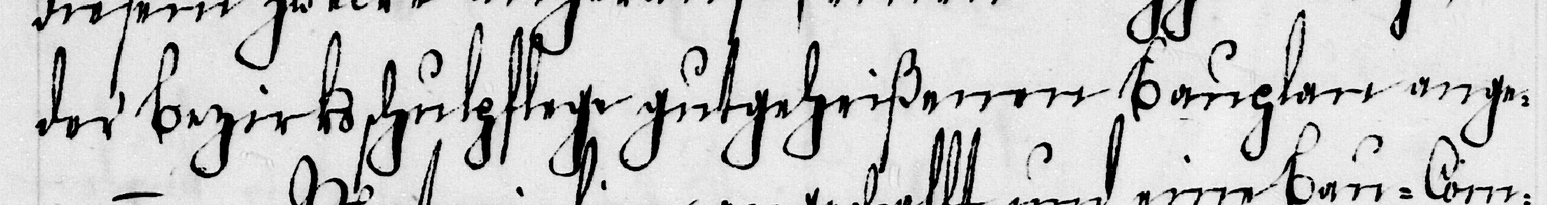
der Bezirksschulpflege gutgeheißenen Bauplan ange¬
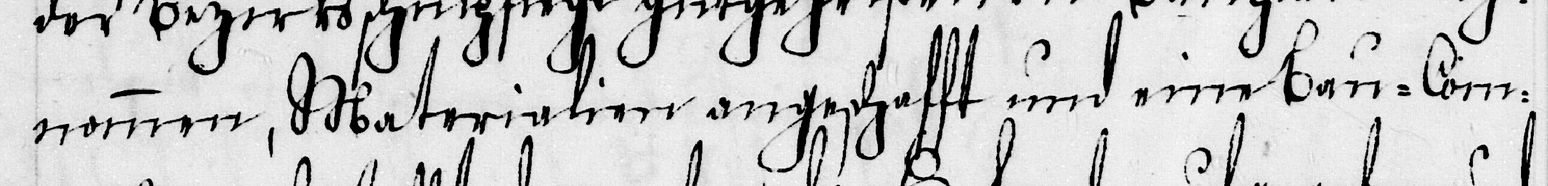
nommen, Materialien angeschafft und eine Bau-Com¬
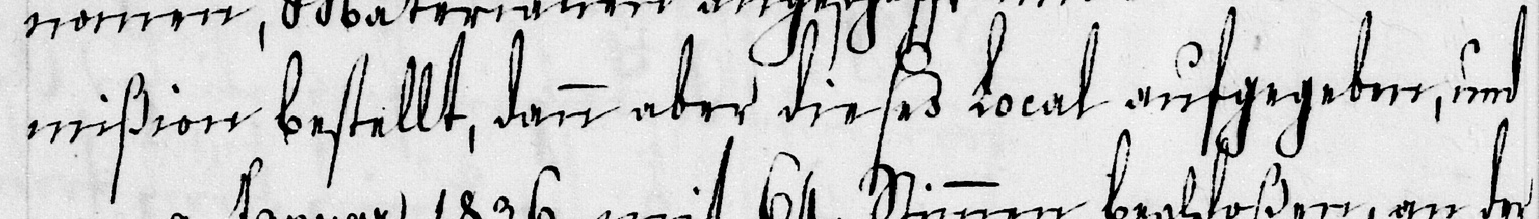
mißion bestellt, dann aber dieses Local aufgegeben, und
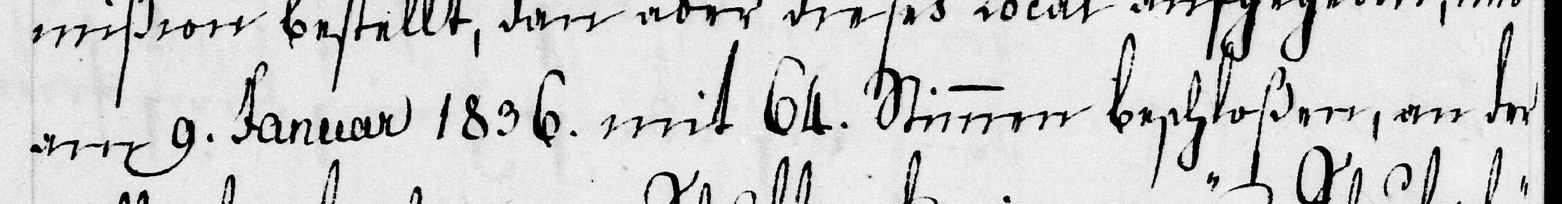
am 9. Januar 1836. mit 64. Stimmen beschloßen, an der
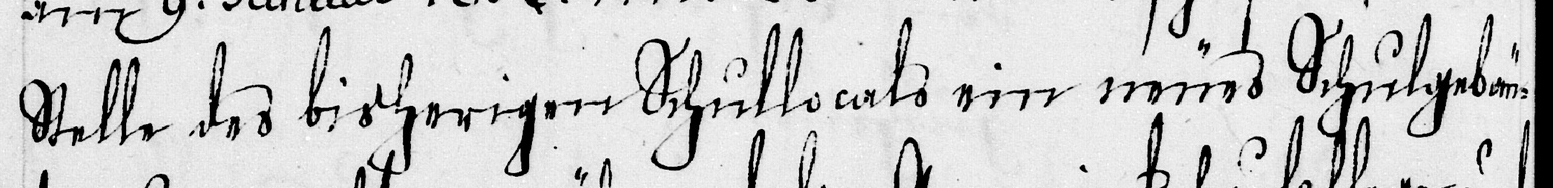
Stelle des bisherigen Schullocals ein neues Schulgebäu¬
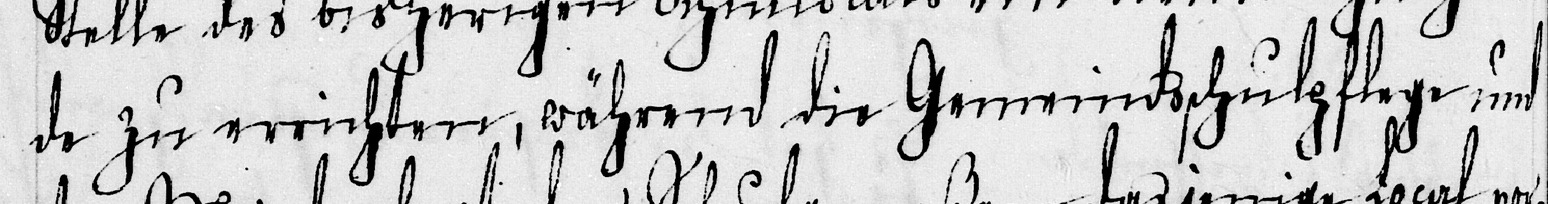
de zu errichten, während die Gemeindsschulpflege und
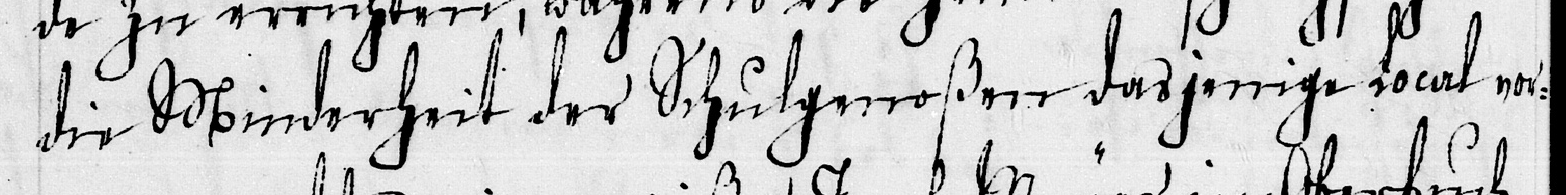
die Minderheit der Schulgenoßen dasjenige Local vo¬
